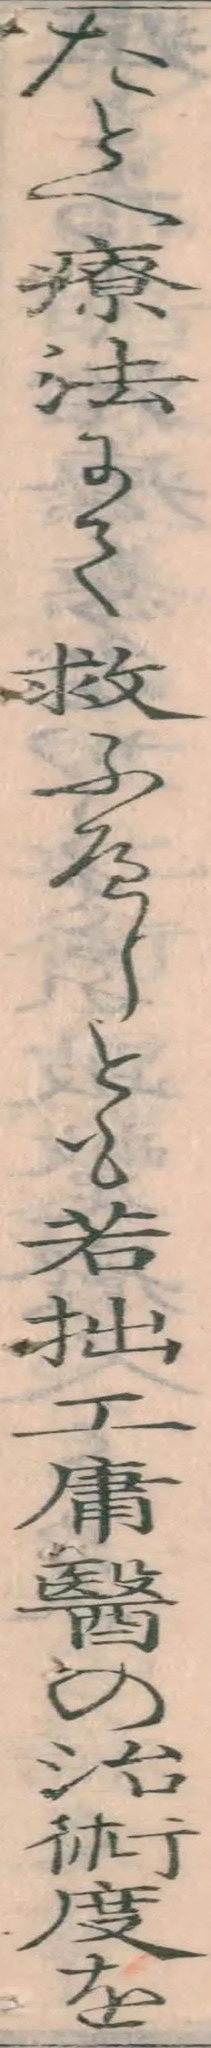たとへ療法にて救ふべしとも若拙工庸醫の治術度を
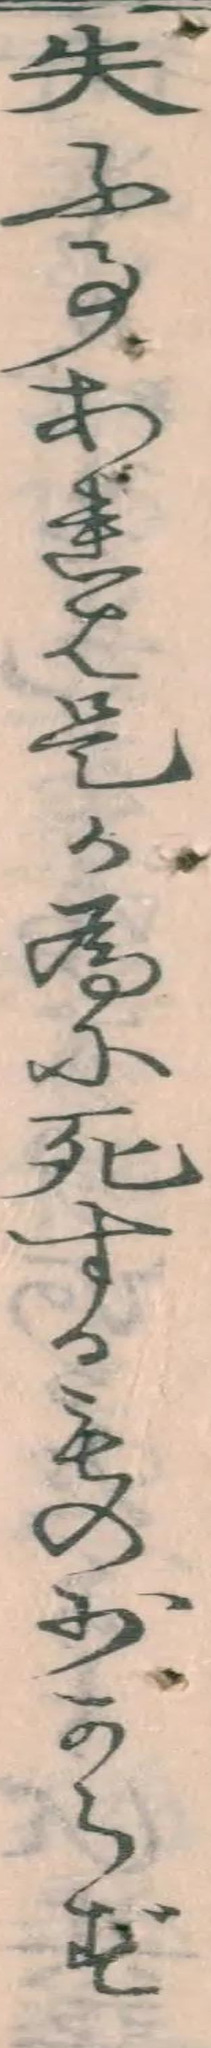失ふ事あれは是か為に死するもの少からず
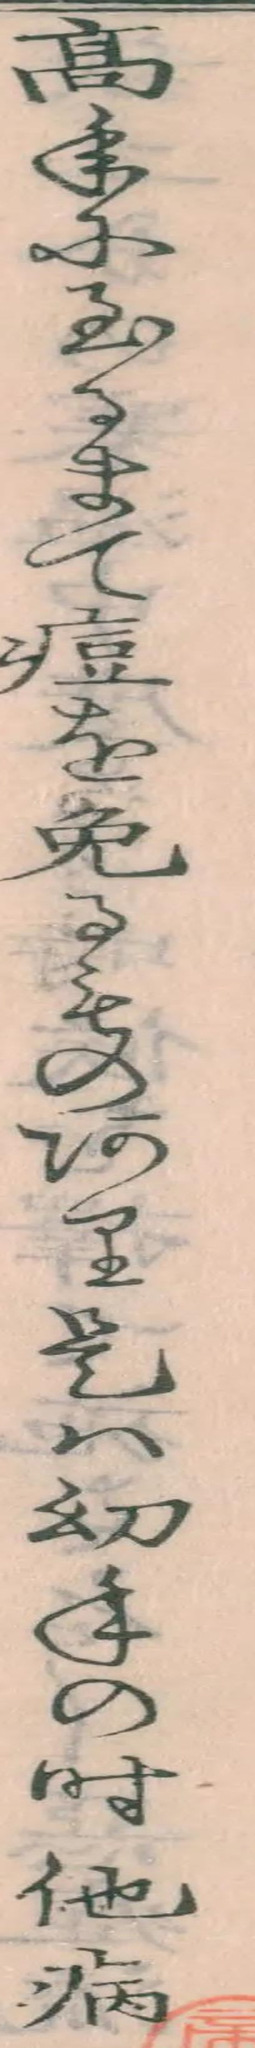高年に至るまて痘を免るものあり是は幼年の時他病
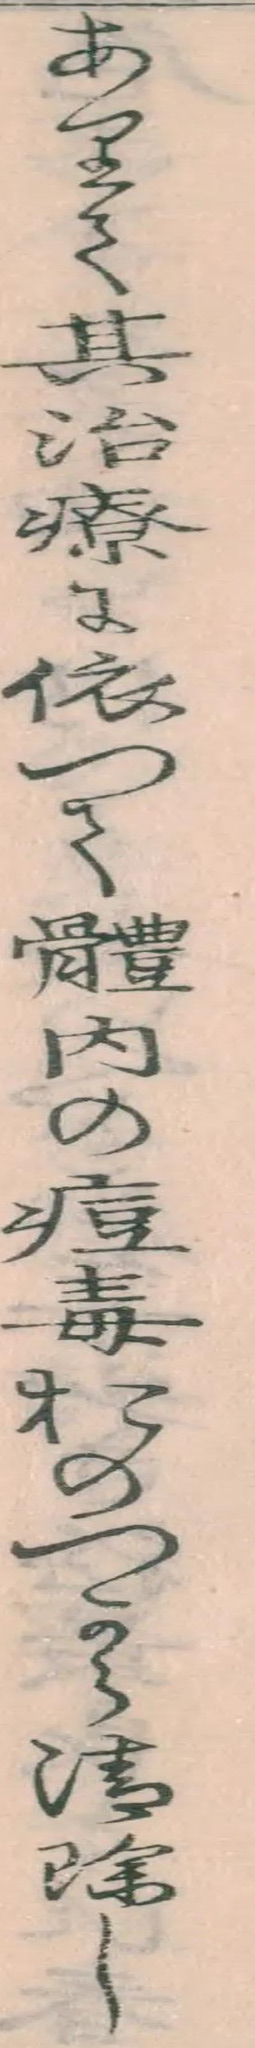ありて其治療に依つて體内の痘毒おのつから清除し
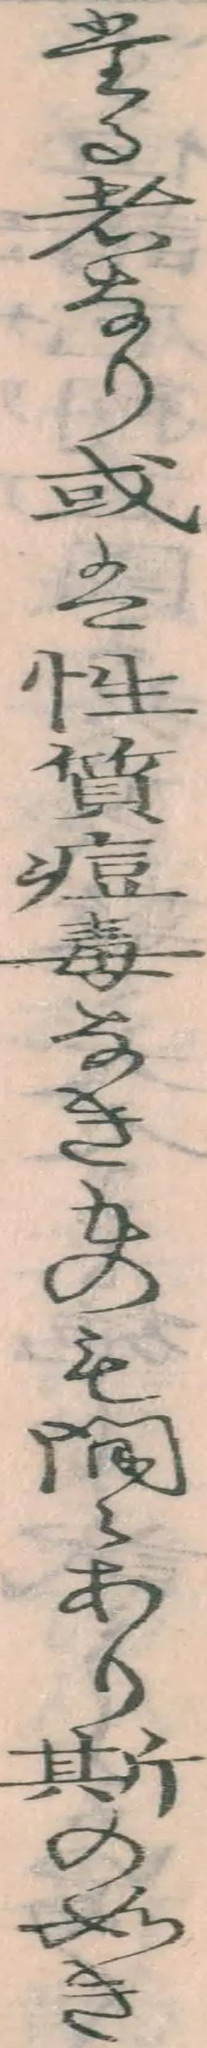たる者なり或は性質痘毒なきものも間々あり斯の如き
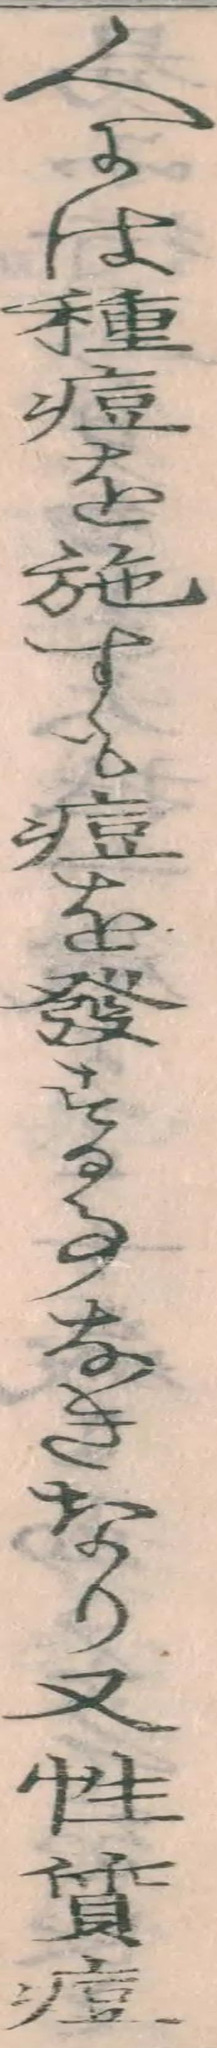人には種痘を施すも痘を發する事なきなり又性質痘
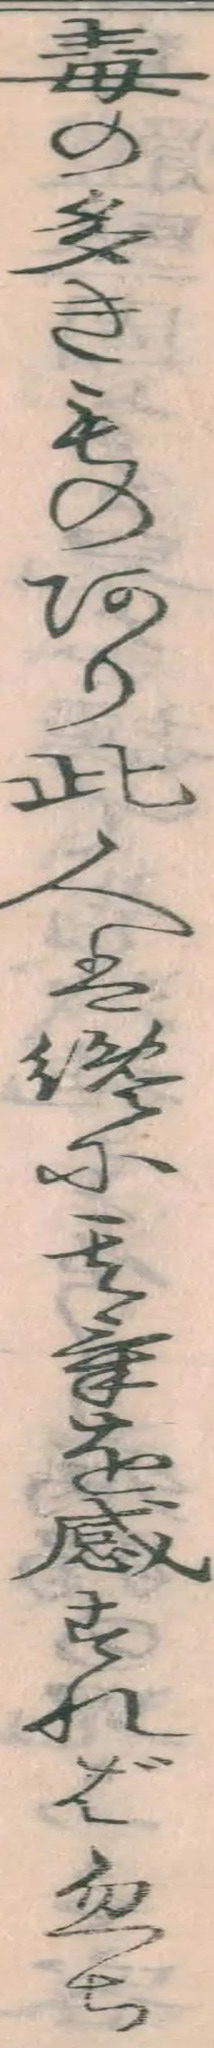毒の多きものあり此人は纔に其気を感すれば勿つち
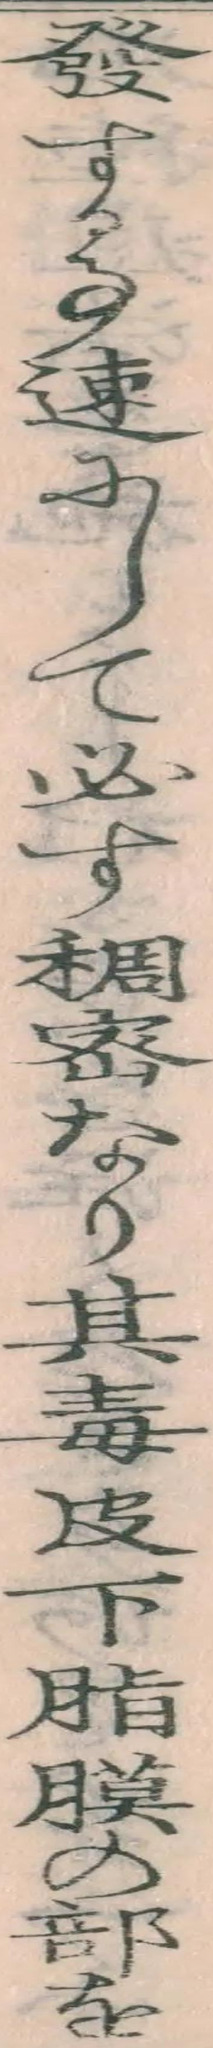發する事速にして必す稠密なり其毒皮下脂膜の部を
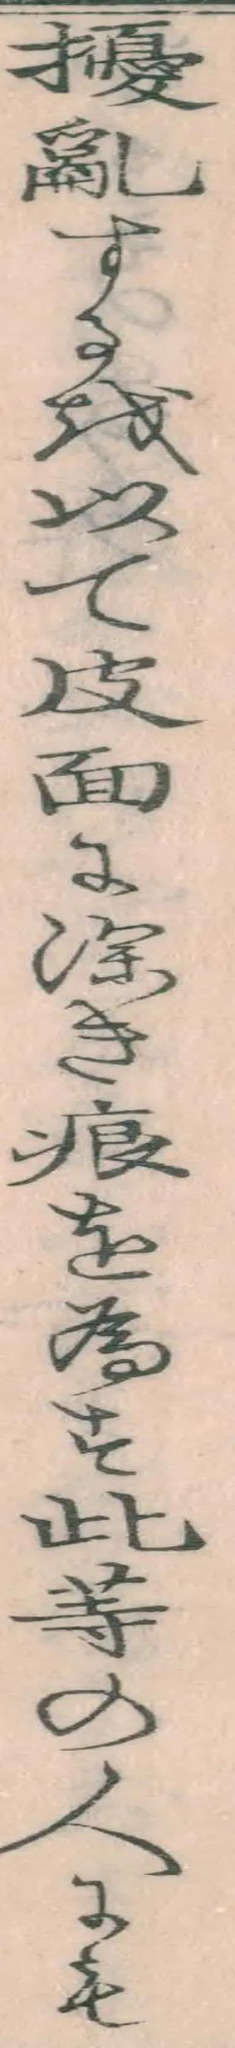擾亂するを以て皮面に深き痕を為す此等の人にも
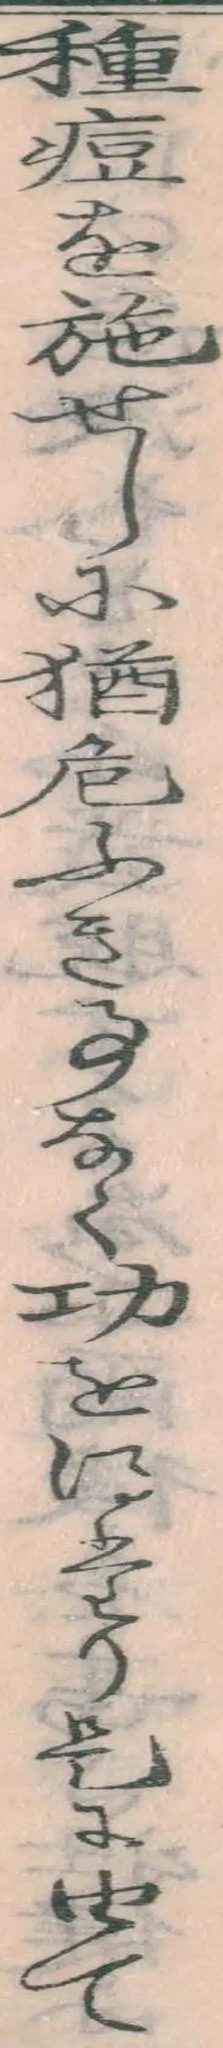種痘を施せしに猶危ふき事なく功をつたり是に由て
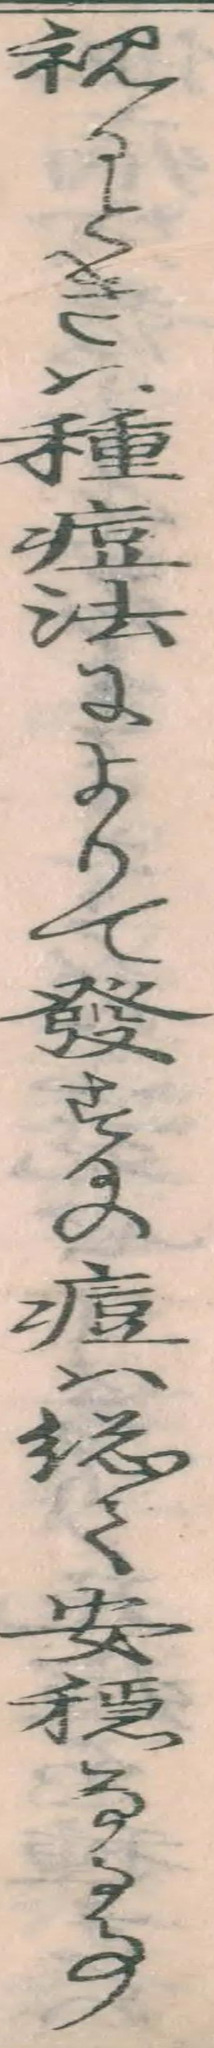祝るときは種痘によりて發するの痘は總て安穏なる事
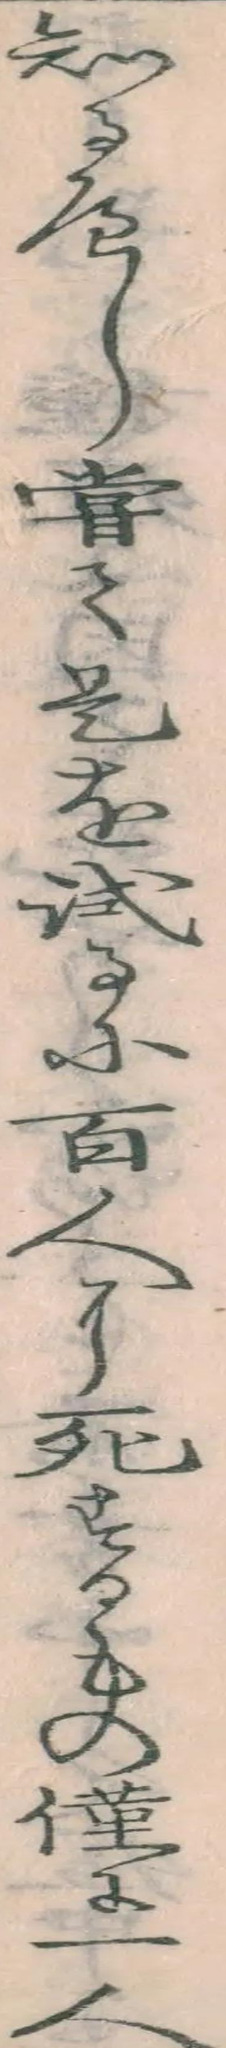知るべし嘗て是を試るに百人に死するもの僅に一人

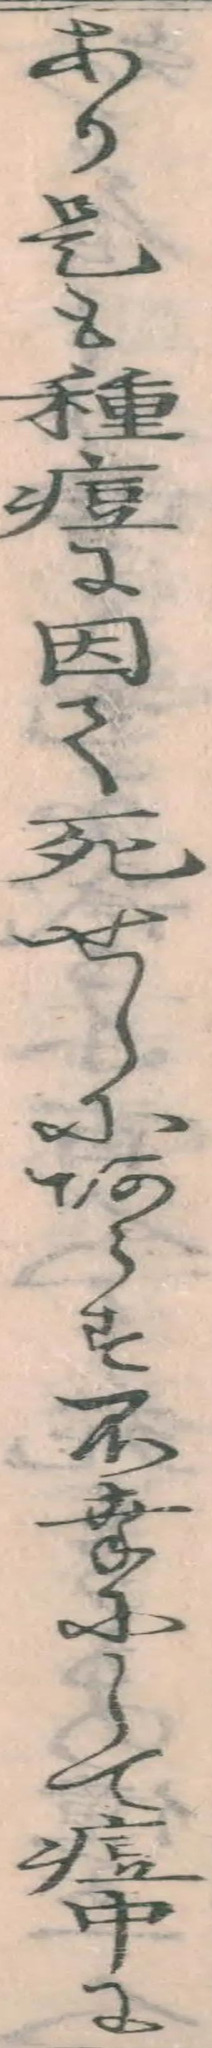あり是も種痘に因て死せしにあらす不幸にして痘中に
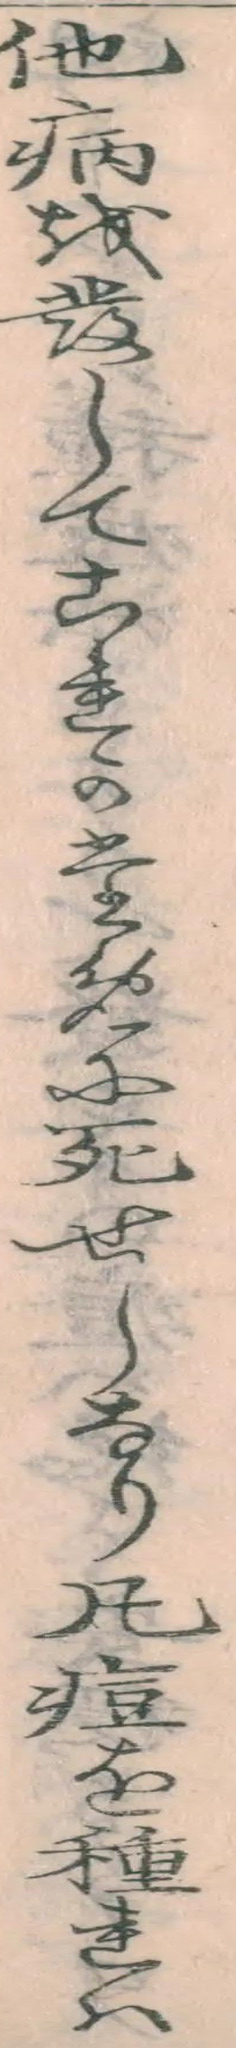他病を發してこれかために死せしなり凡痘を種れは
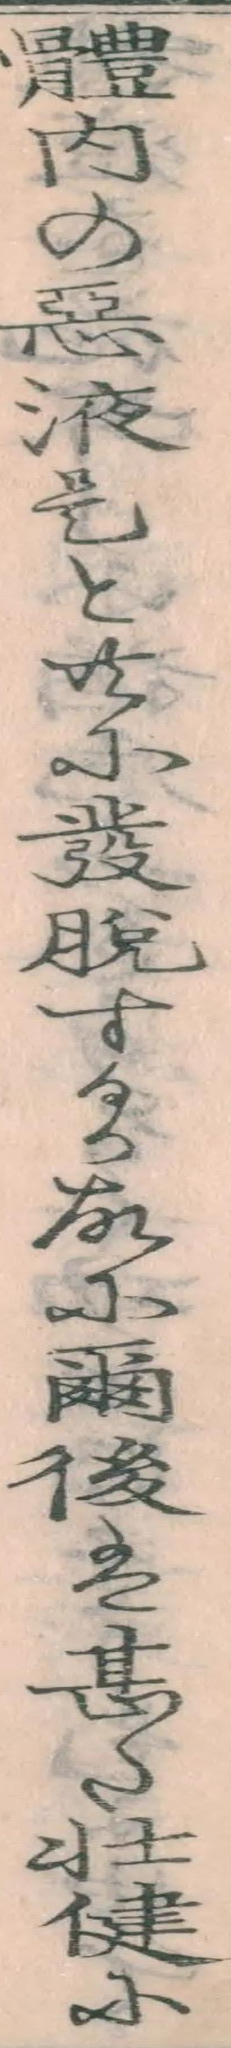體内の惡液是と共に發脱するか故に爾後は甚た壮健に
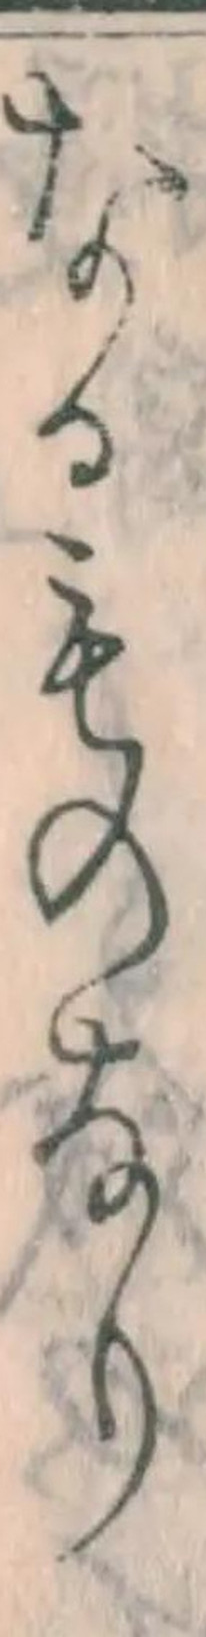なるものなり
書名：種痘新編
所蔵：国立国会図書館 National Diet Library, JAPAN
